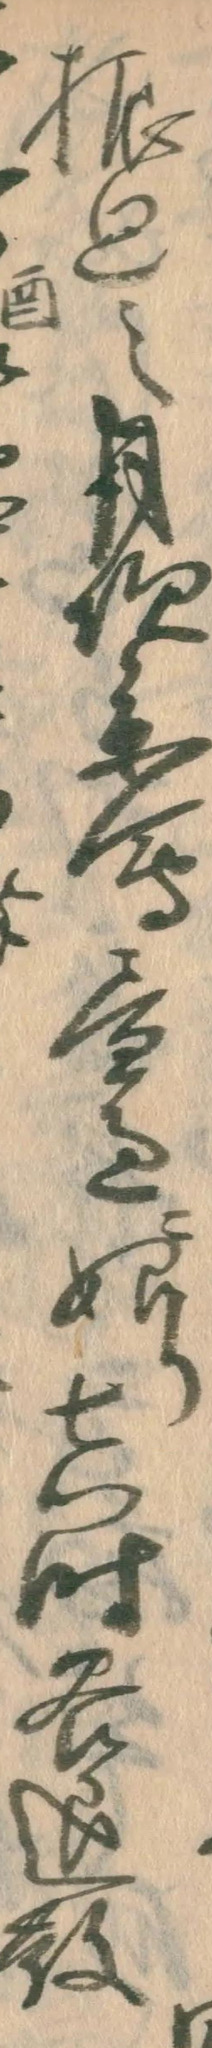振廻之月次参会昼過ニ始り七ツ時各退散
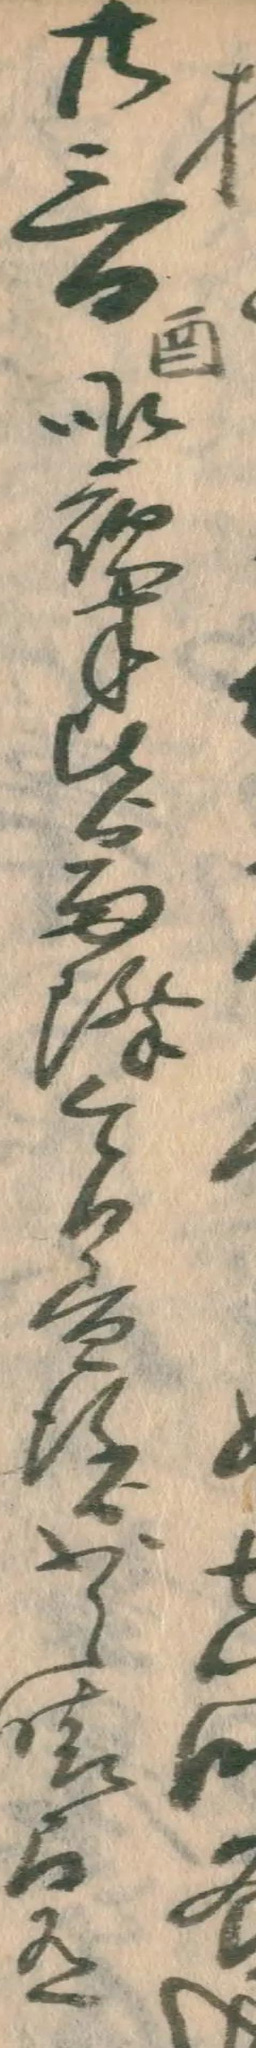廿三日酉昨夜半比ゟ雨降今日昼後ゟ少々晴間有
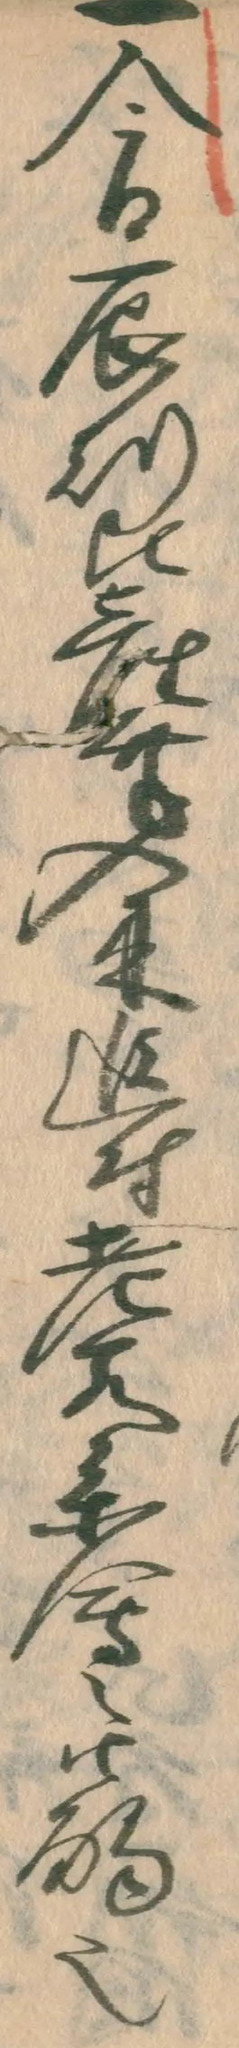一今日辰ノ刻比産幸入来追付老若参会之御触也
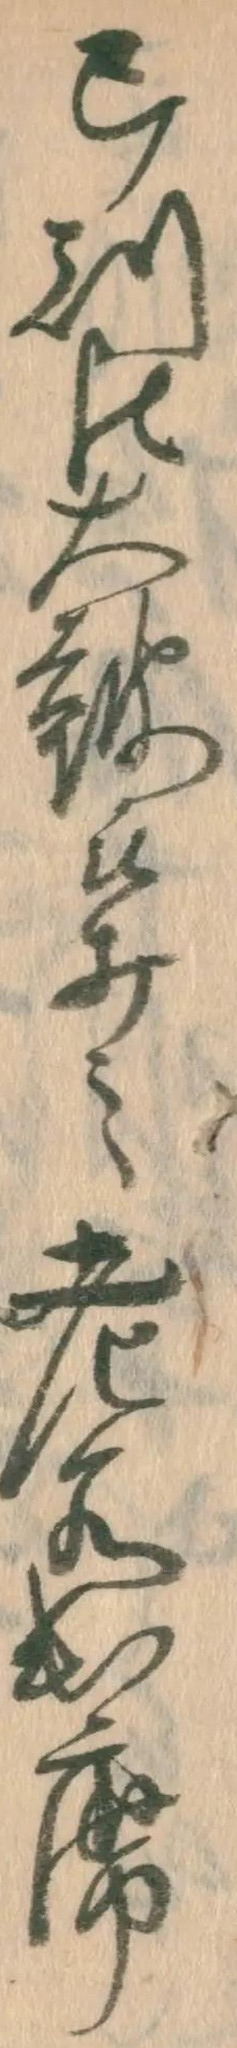巳ノ刻比大鼓被打之老若出席
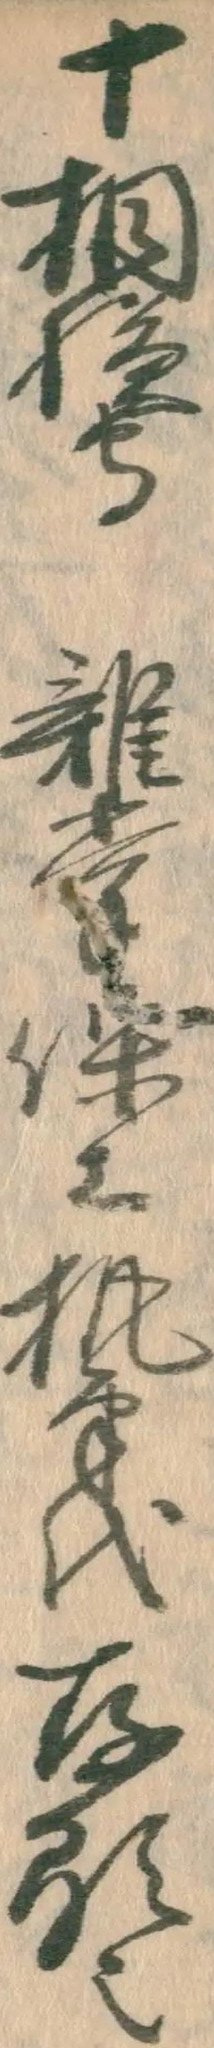十相模守雑掌保土執筆代存顕也
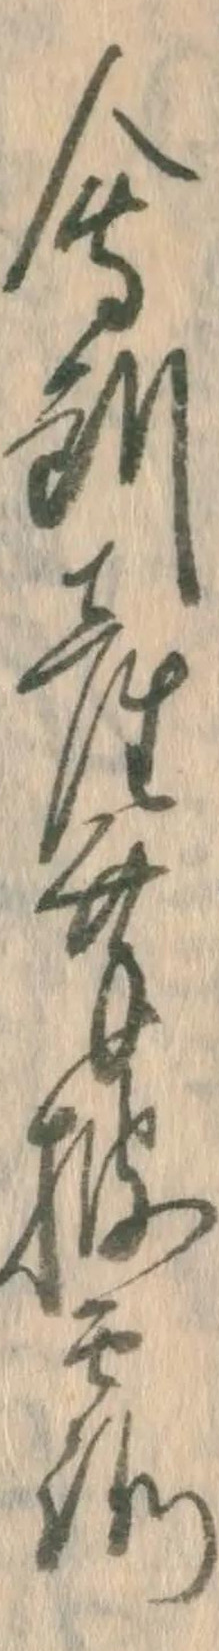会所産幸披露
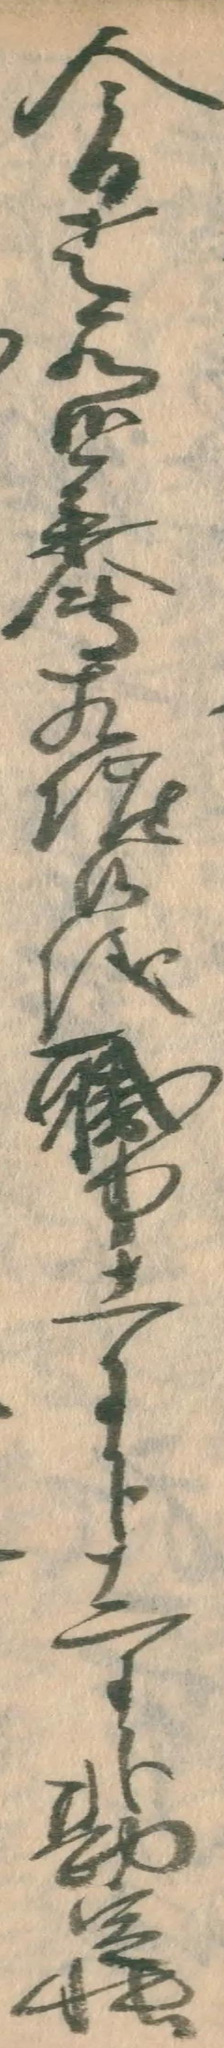今日老若御参会相催候儀職中十一月分十二月分勘定帳
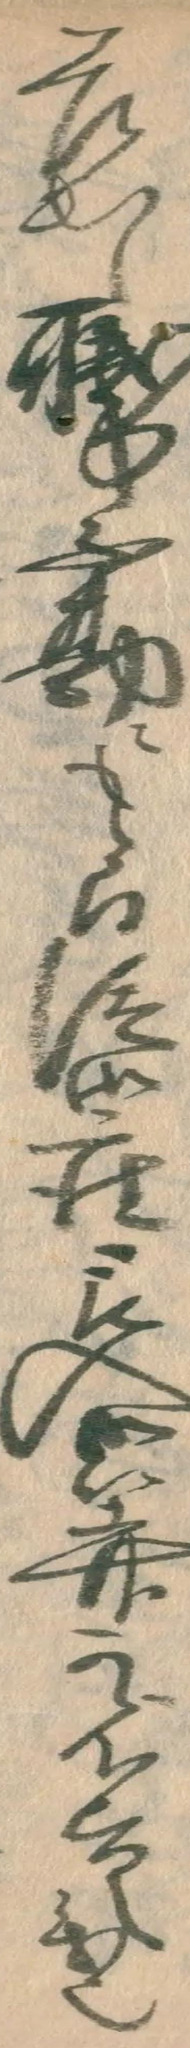差出候職中不勘ニも候間従御座被入御算可被下旨之義也
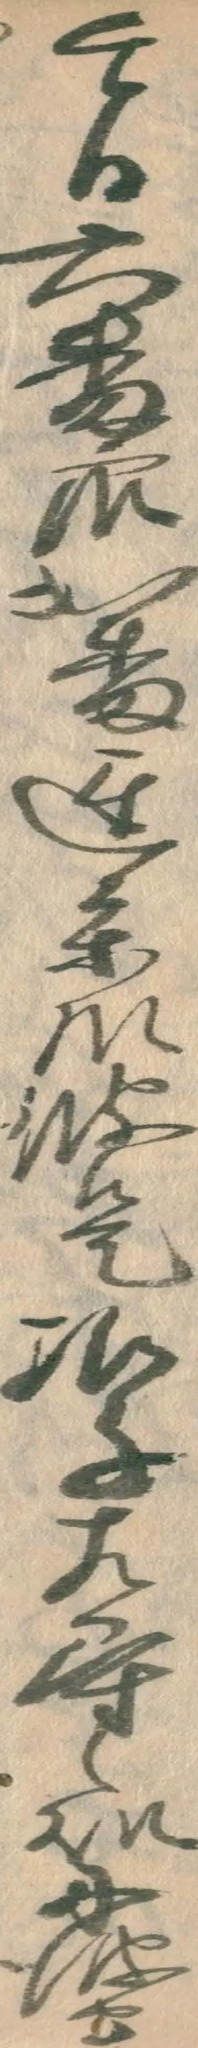今日六番衆出番遅参故彼是様子相尋候処丹波守
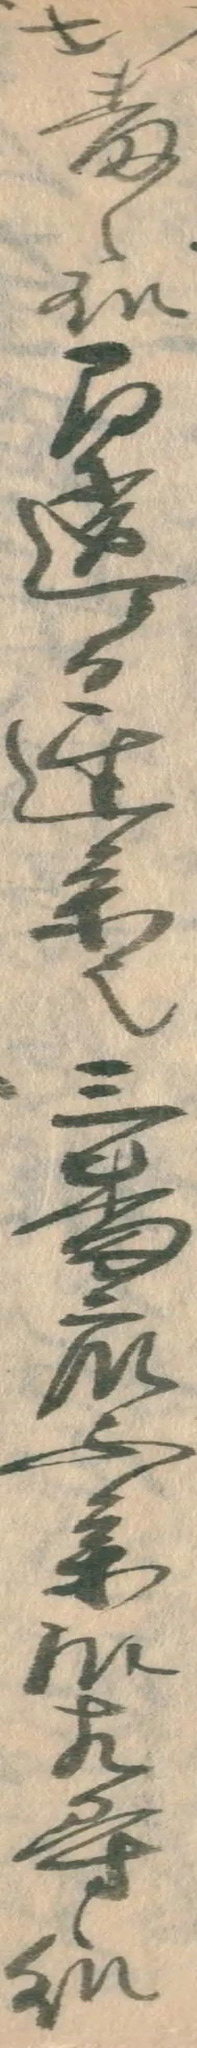出番候処間違ニ而遅参也三番衆不参故相尋候処
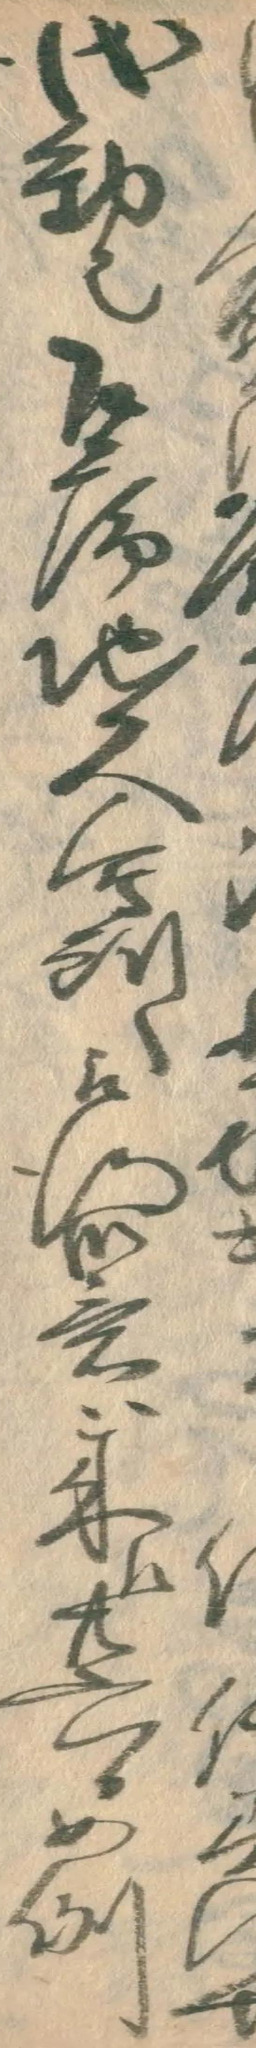代勤也乍序地久会所へ被得御意ハ来ル廿六日如例
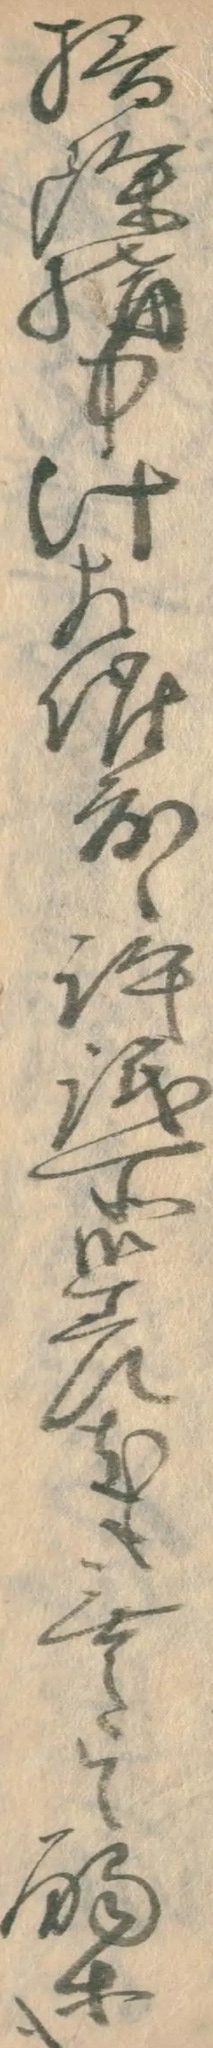掃除構中計相催度候評議所御差支も無之候ハヽ触等も

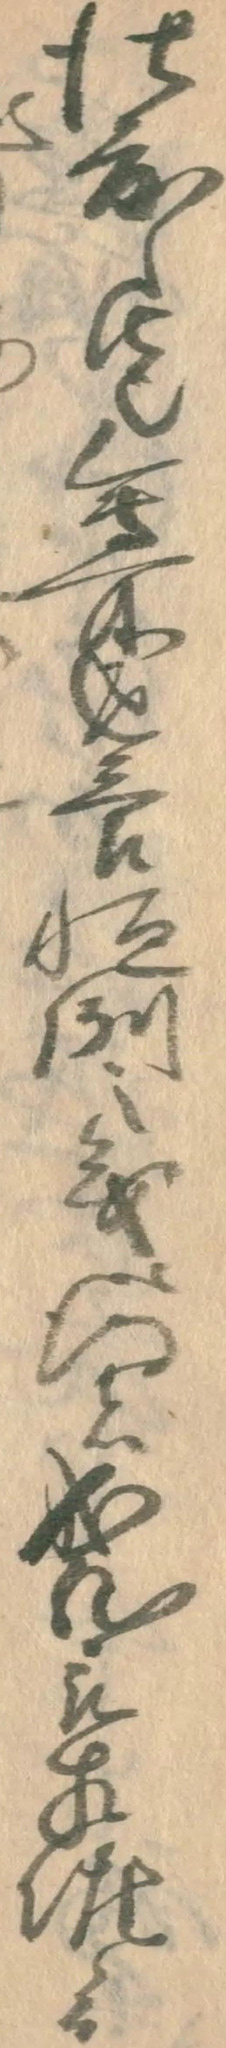仕度之由也会所返答恒例之義ニ候得者成程相催候而
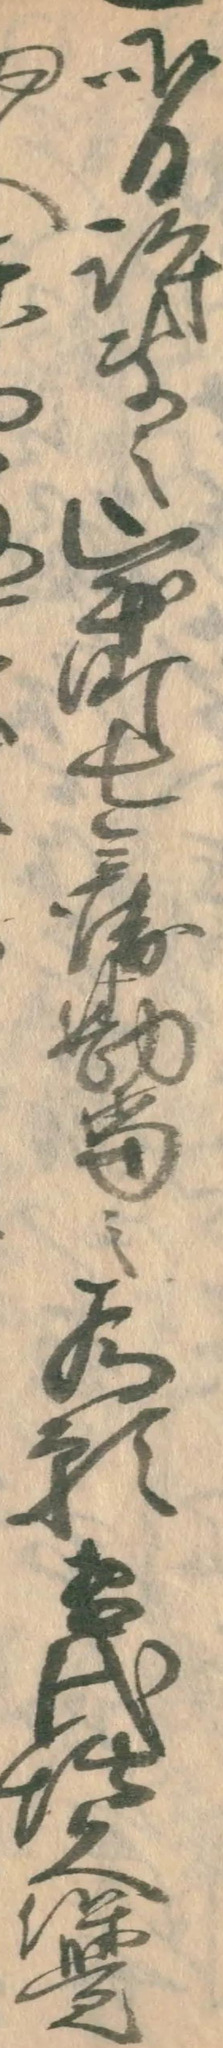一昨日評決之山本町長兵衛勘当之為願惣代博久保覚
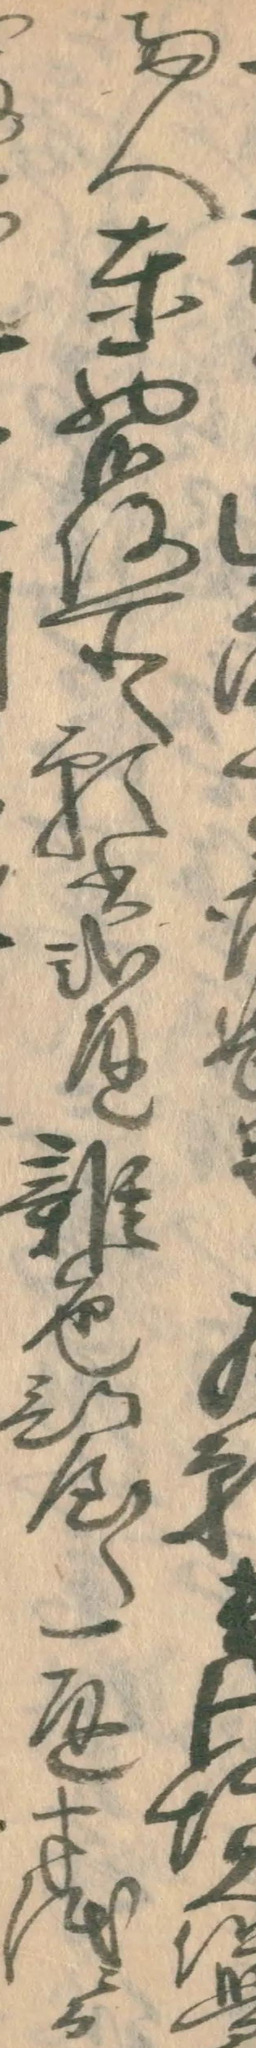両人東西御役所へ願書弐通雑色部屋へ一通半紙ニ而
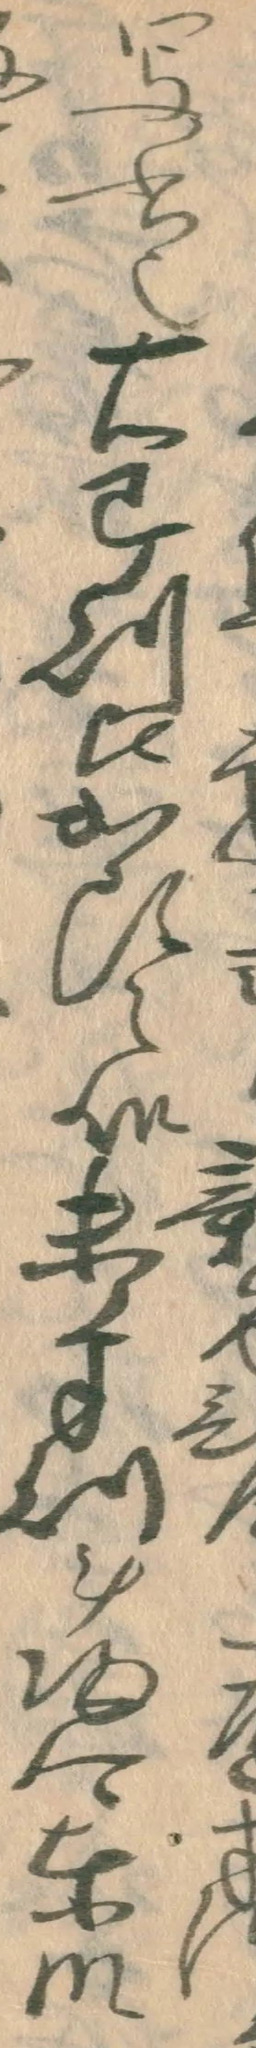写書也右巳ノ刻比出頭之処未ノ半刻計帰郷東御
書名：賀茂社記録. 第60冊
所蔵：国立国会図書館 National Diet Library, JAPAN
